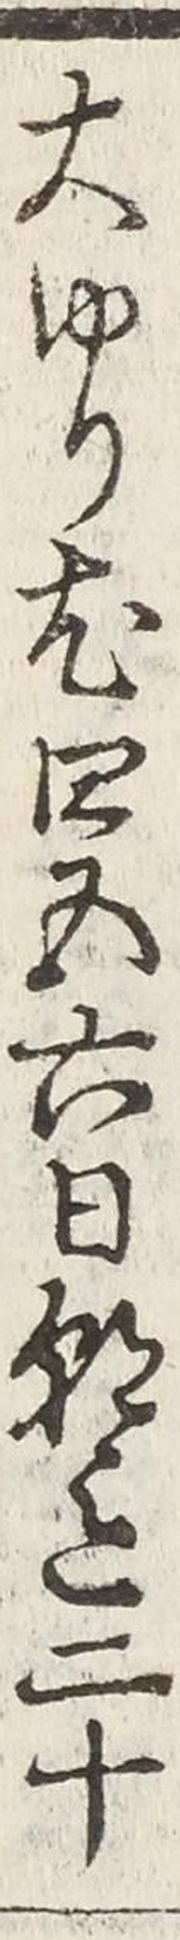大ゆり尤四五六日朝迄二十
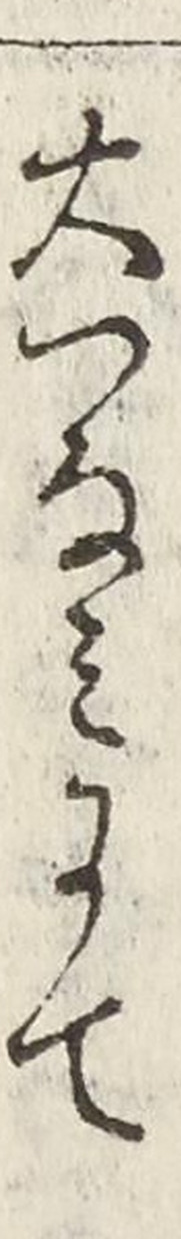大つなみにて
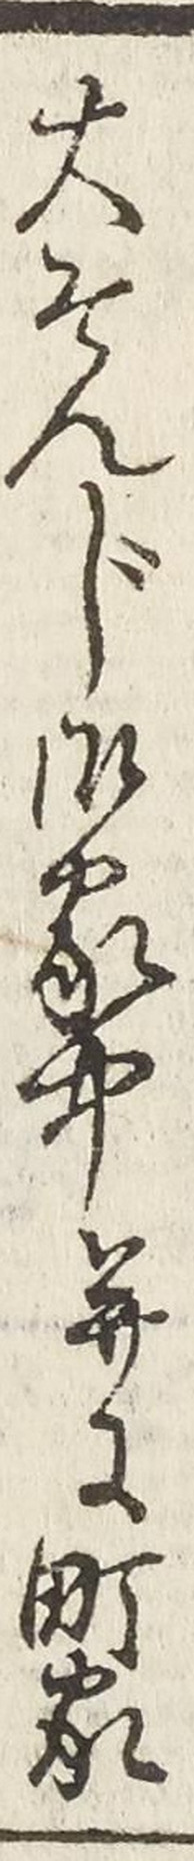大そんじ御家中并に町家
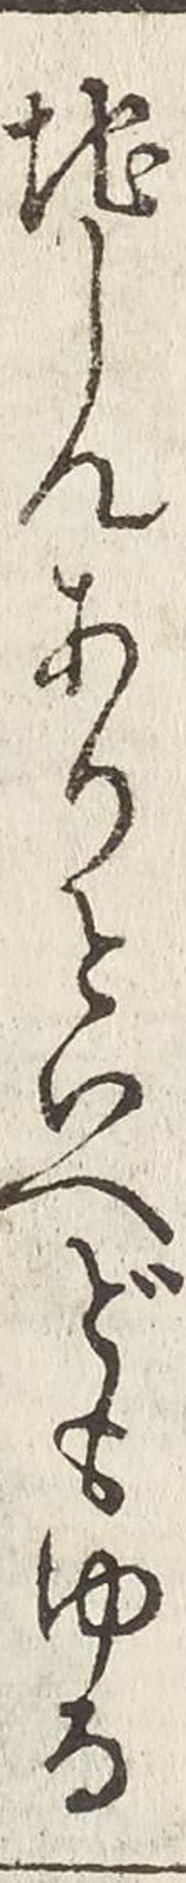地しんありといへどもゆる

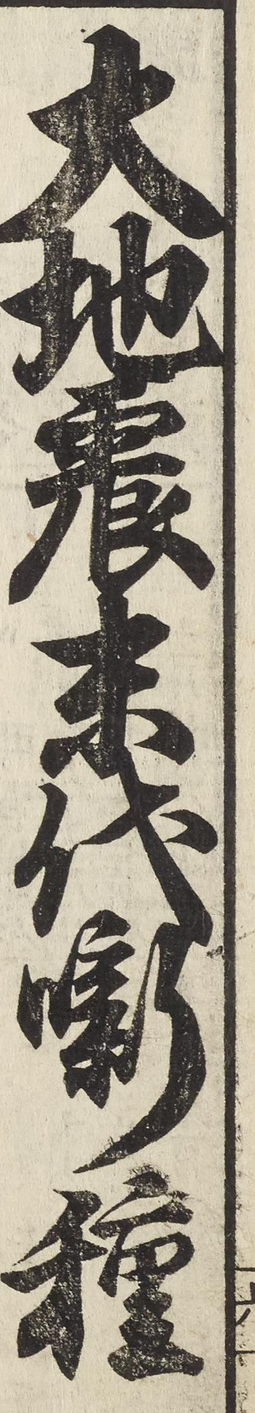大地震末代噺種
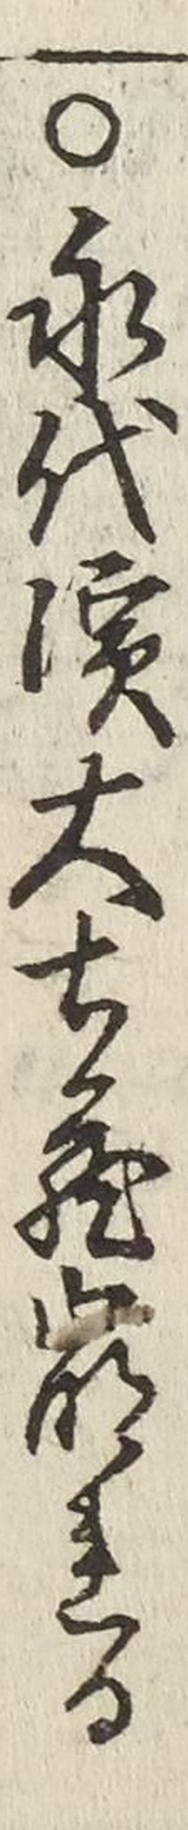○永代浜大土蔵崩れる
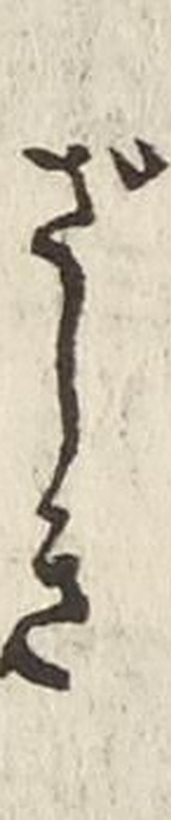ざしき
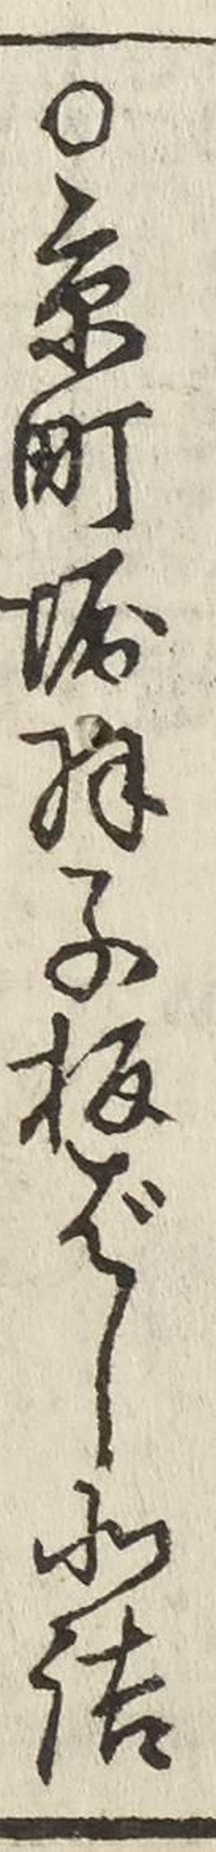○京町堀羽子板ばし北詰
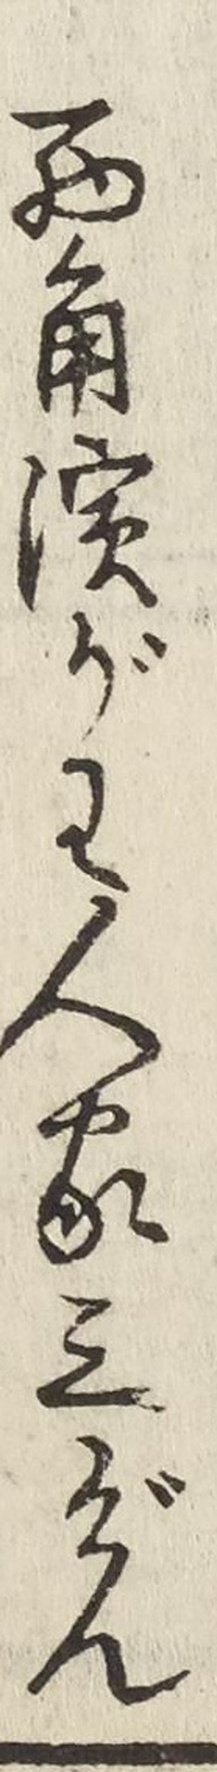西角浜がわ人家三げん
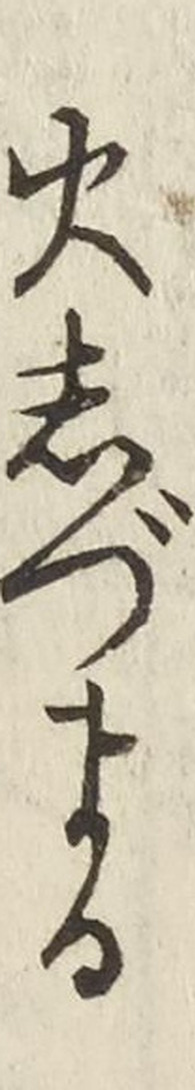火しづまる
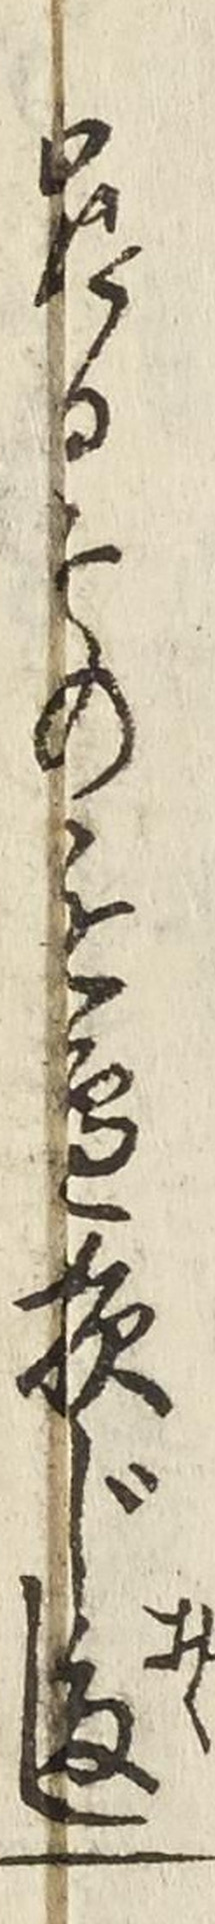崩るその近辺損じ多し
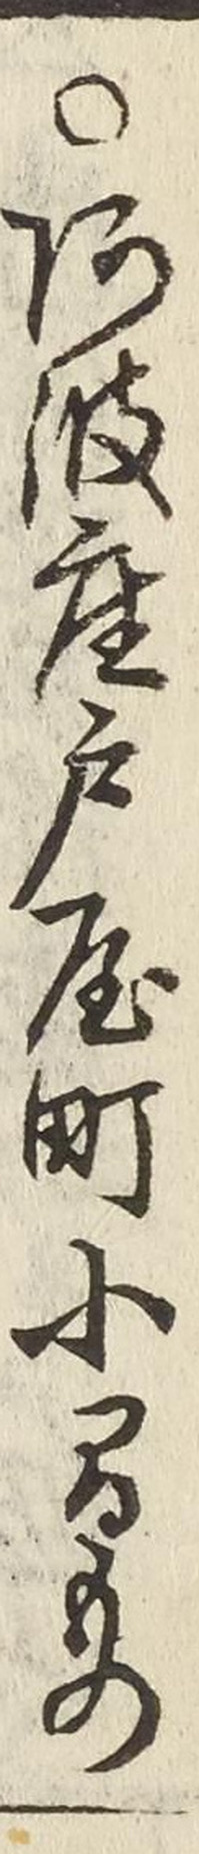○阿波座戸屋町小間もの
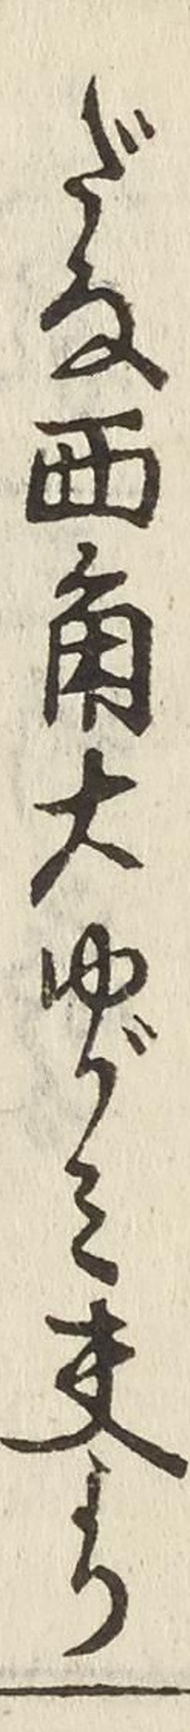だな西角大ゆがみ夫より
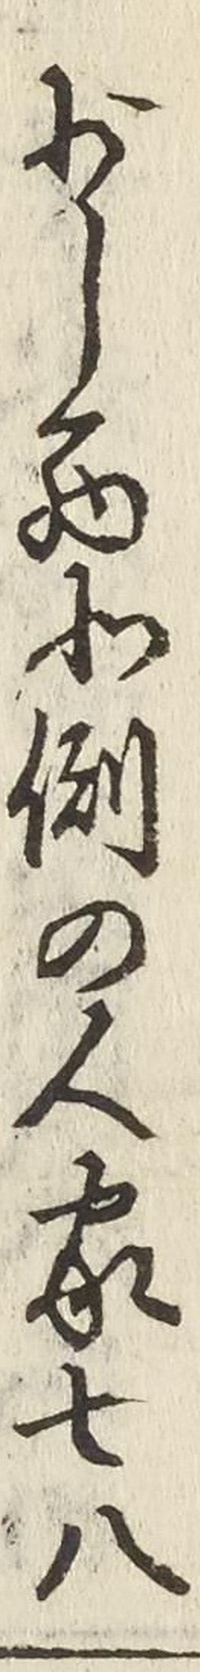少し西北側の人家七八
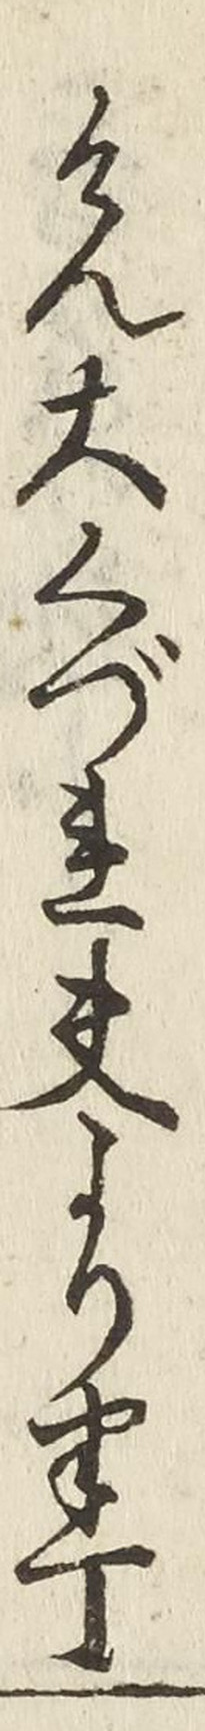けん大くづれ夫より半丁
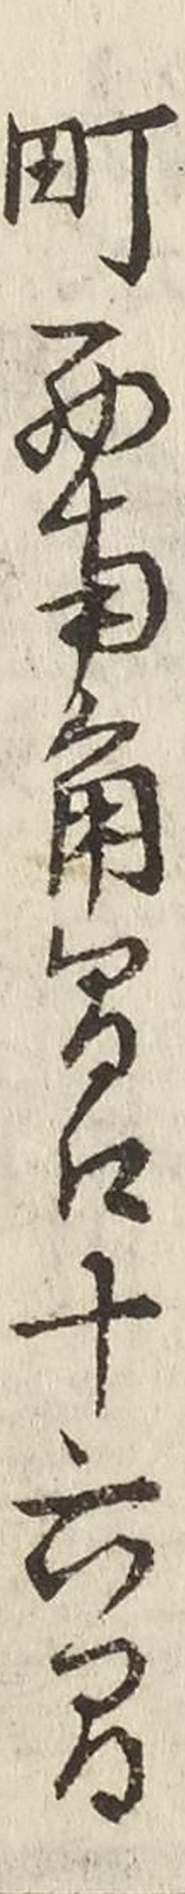町西南角間口十六間
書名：大地震大津浪末代噺種　（二編　全）
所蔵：東京大学地震研究所図書室 Earthquake Research Institute Library, The University of Tokyo, JAPAN
